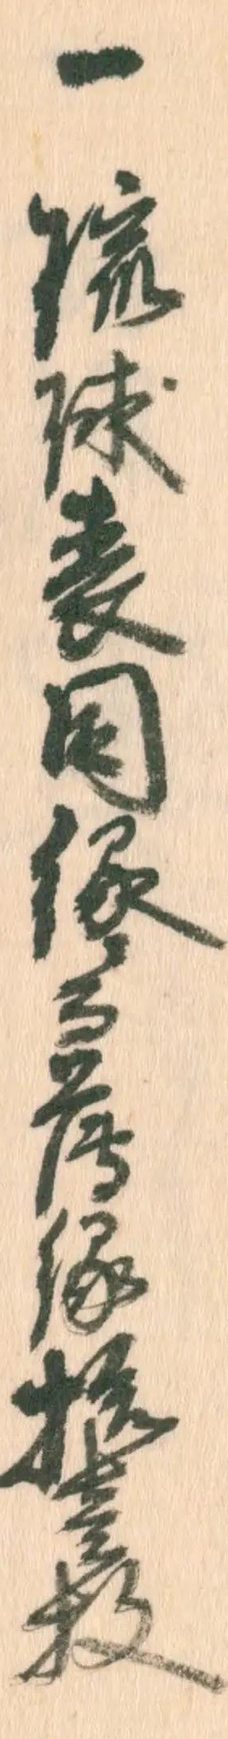一琉球表同縁に而薄縁拾壱枚
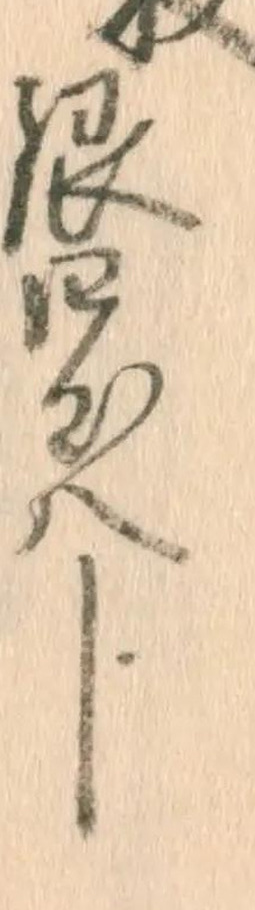銀四匁八分
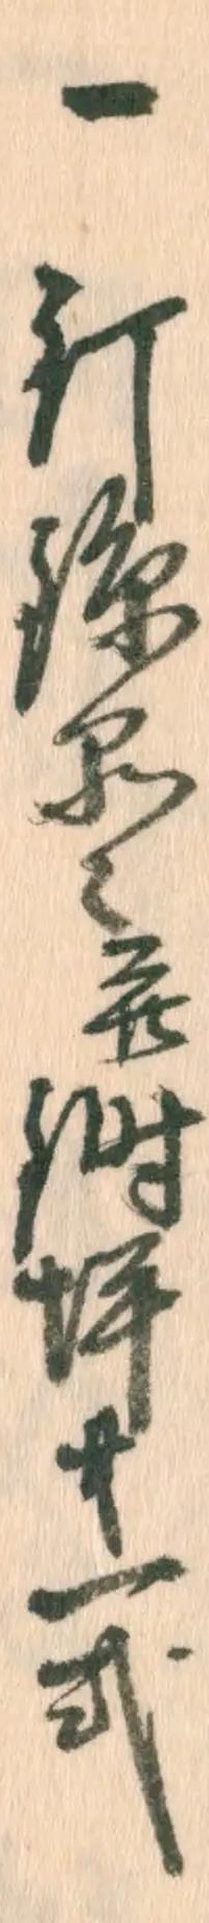一釘銯品々并坪共一式
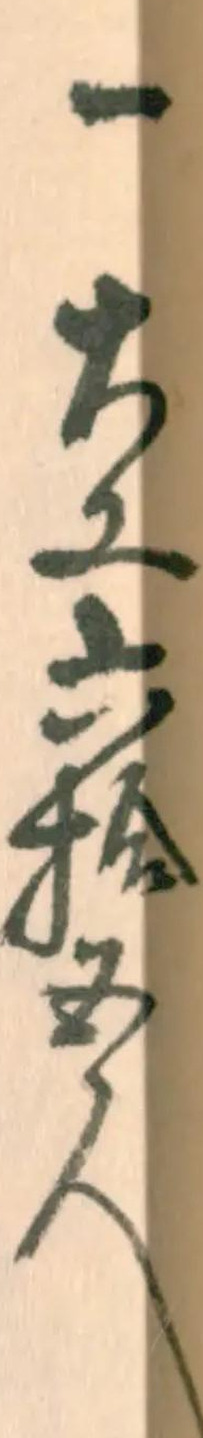一大工六拾五人
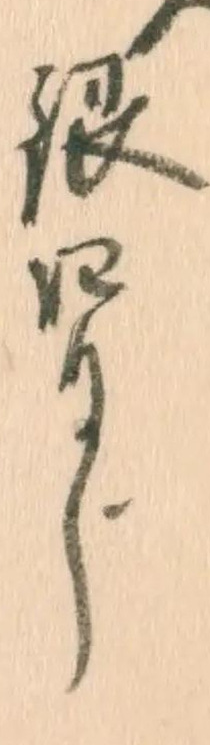銀四匁
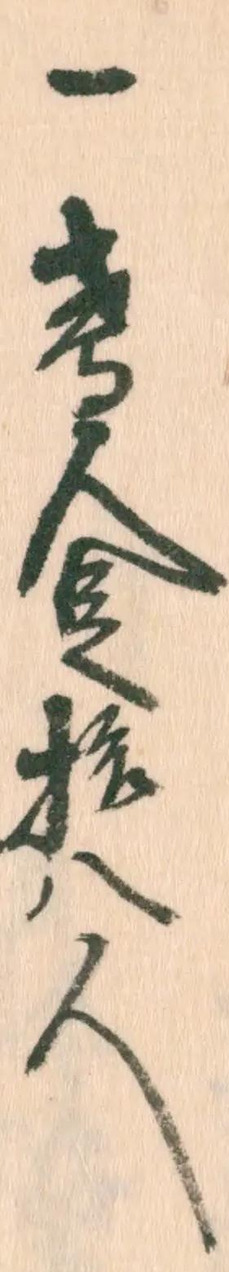一鳶人足拾八人
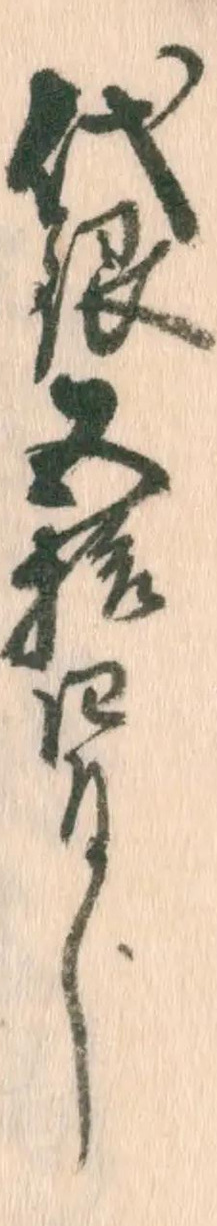代銀五拾四匁但壱人
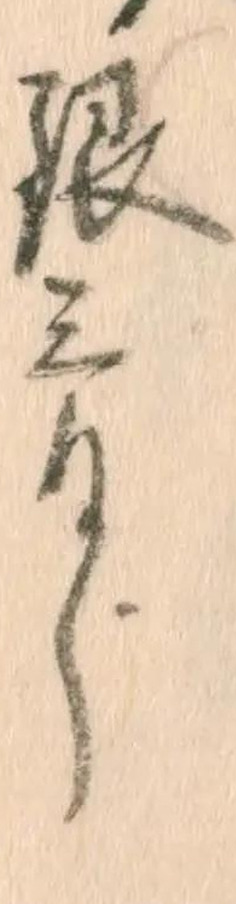銀三匁
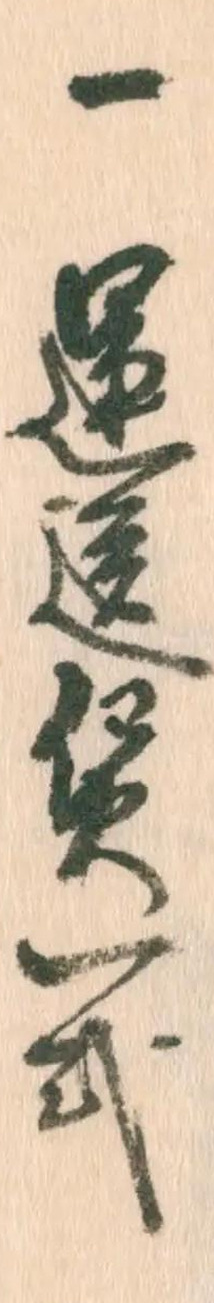一運送賃一式
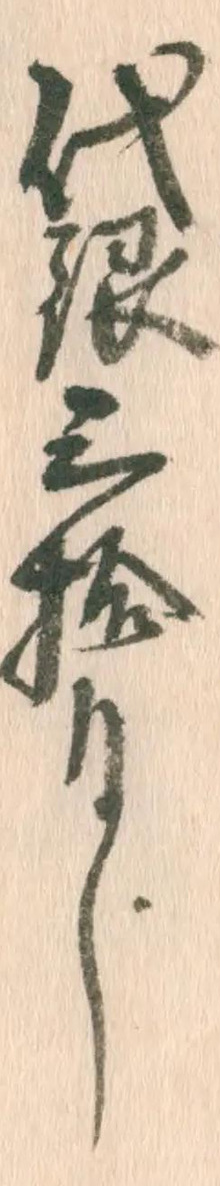代銀参拾匁

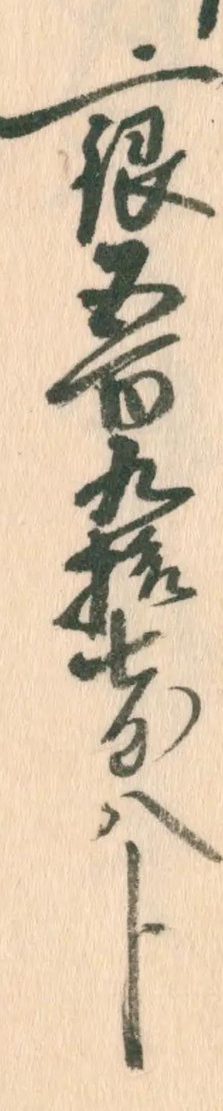〆銀五百九拾七匁八分
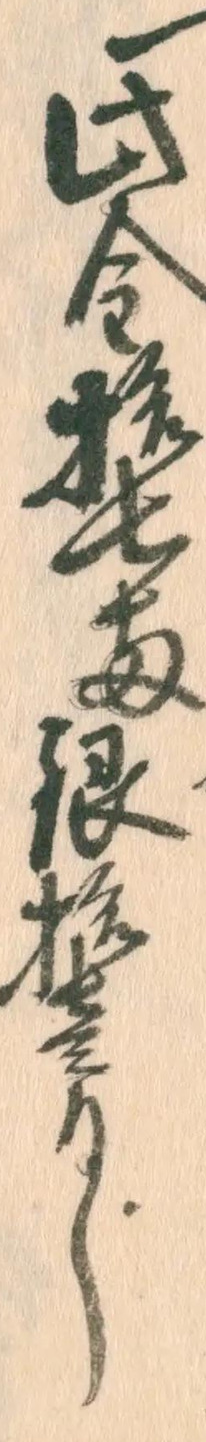此金拾七両銀拾壱匁
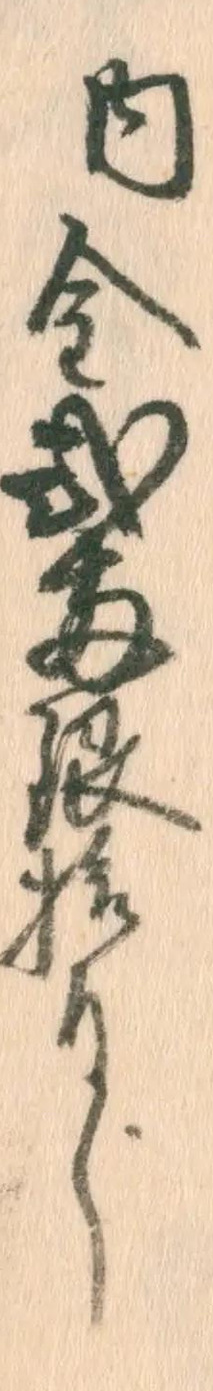内金弐両銀拾匁
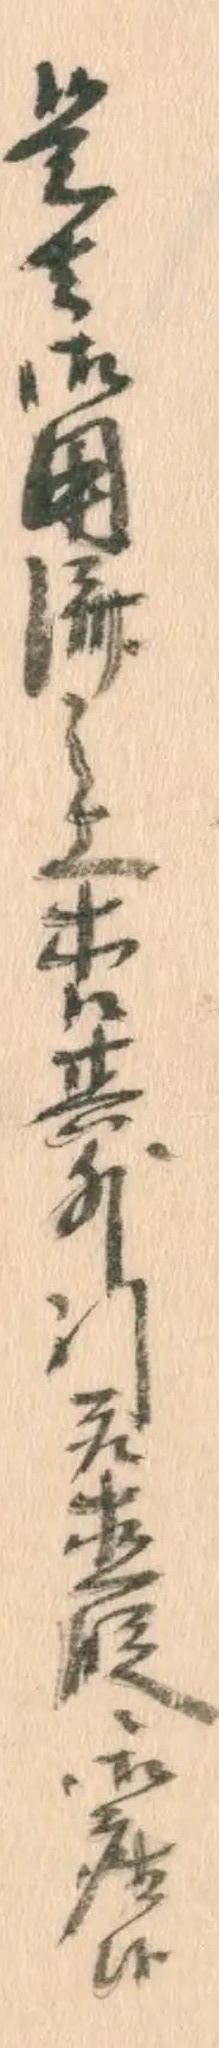是は御用済之上木口其外引取直段御座候
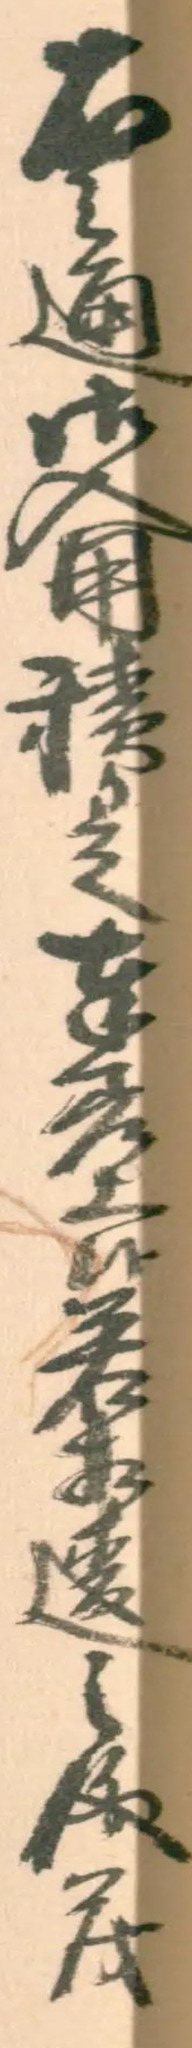右之通御入用積り立奉差上候若相違之儀も
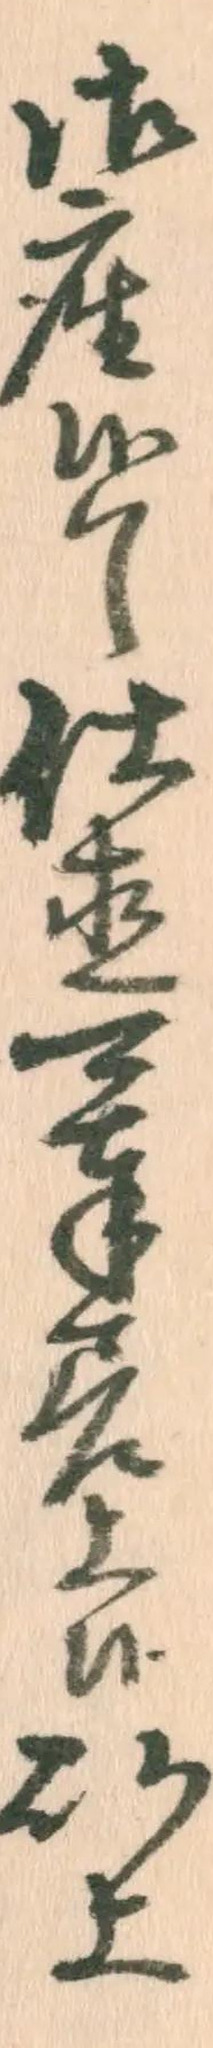御座候はゝ仕直可奉差上候以上
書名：三十三間堂. [1]
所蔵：国立国会図書館 National Diet Library, JAPAN
